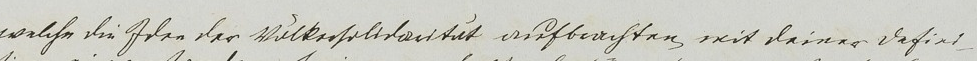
welche die Idee der Völkersolidarität aufbrachten, mit deiner Defini-
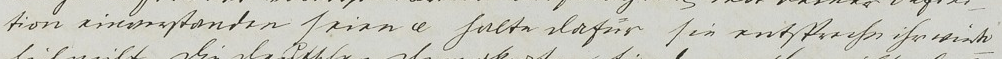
tion einverstanden seien & halte dafür sie entspreche ihr wirk-
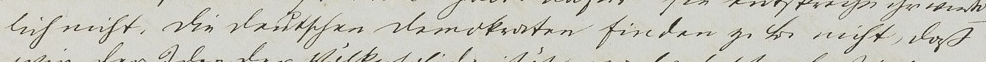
lich nicht. Die deutschen Demokraten finden z. B. nicht, daß
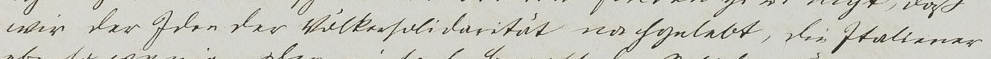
wir der Idee der Völkersolidarität nachgelebt, die Italiener
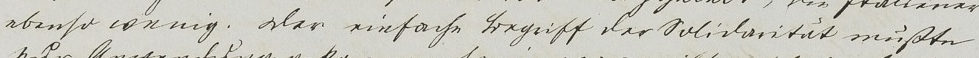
ebenso wenig. Der einfache Begriff der Solidarität müßte
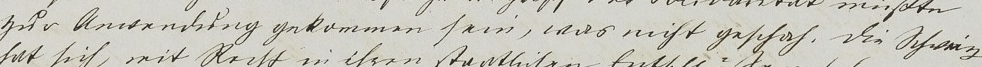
zur Anwendung gekommen sein, was nicht geschah. Die Schweiz
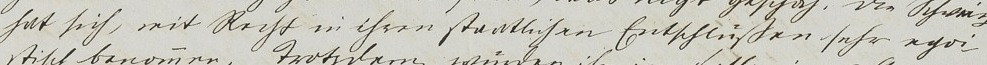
hat sich, mit Recht in ihren staatlichen Entschlüssen sehr egoi-
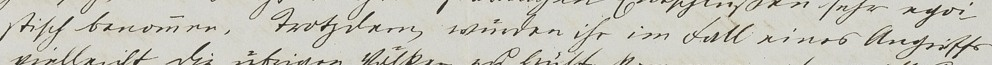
stisch benommen. Trotzdem würden ihr im Fall eines Angriffs
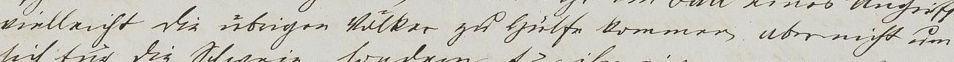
vielleicht die übrigen Völker zu Hülfe kommen, aber nicht um
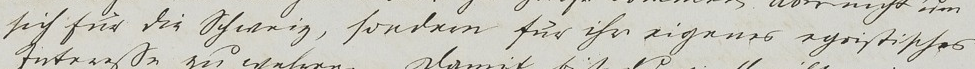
sich für die Schweiz, sondern für ihr eigenes egoistisches
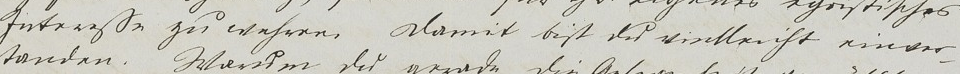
Interesse zu wehren. Damit bist du vielleicht einver-
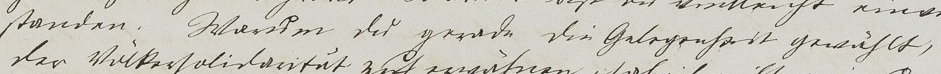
standen. Warum du gerade die Gelegenheit gewählt,
